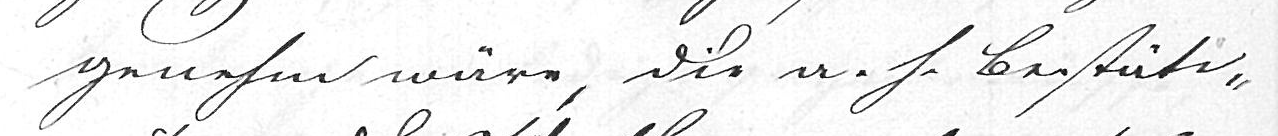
genehm wäre, die a. h. Bestäti-
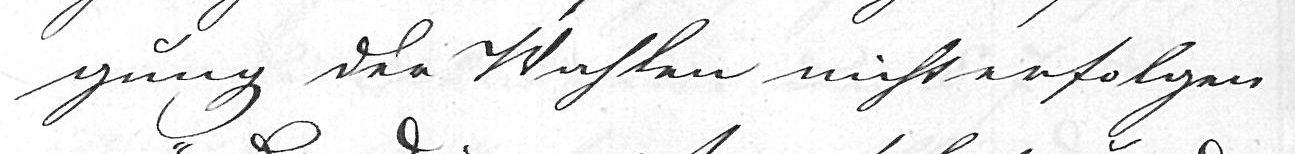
gung der Wahlen nicht erfolgen
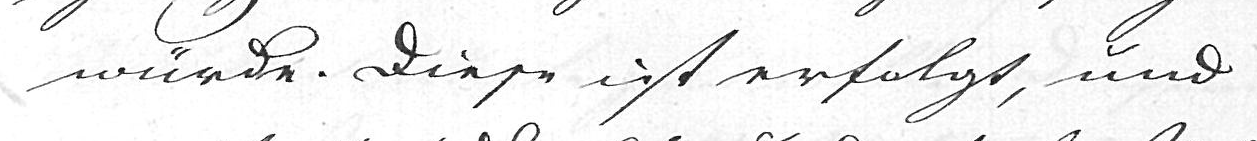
würde. Diese ist erfolgt, und
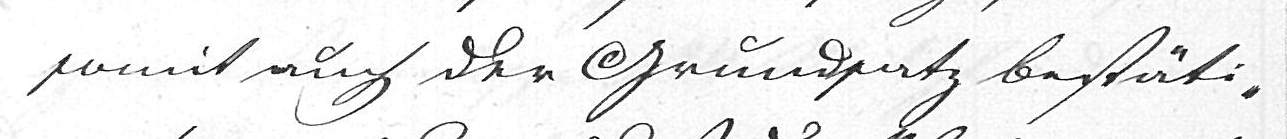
somit auch der Grundsatz bestäti-
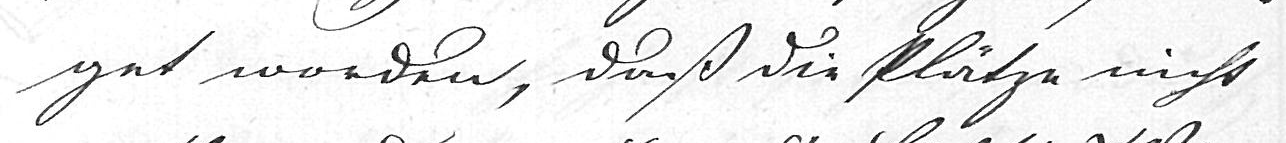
get worden, daß die Plätze nicht
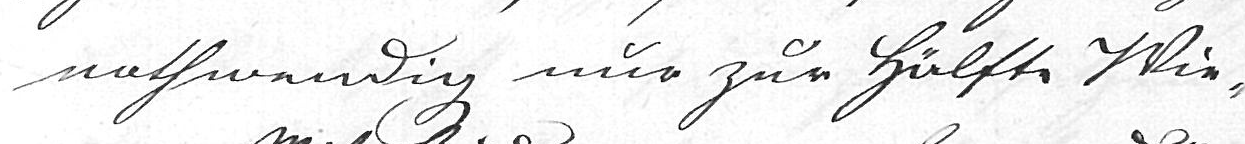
nothwendig nur zur Hälfte Wie-
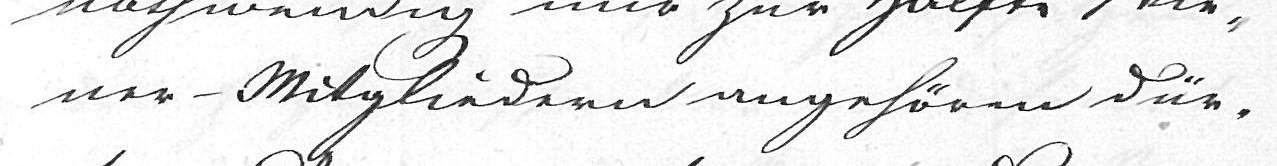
ner-Mitgliedern angehören dür-
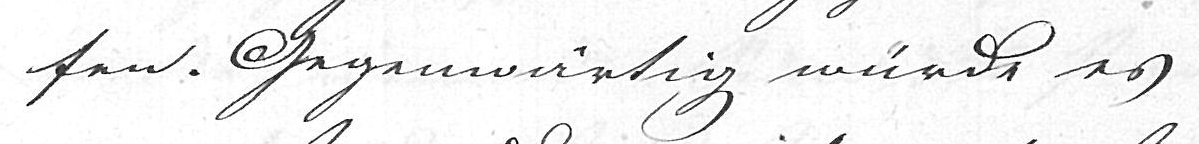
fen. Gegenwärtig würde es
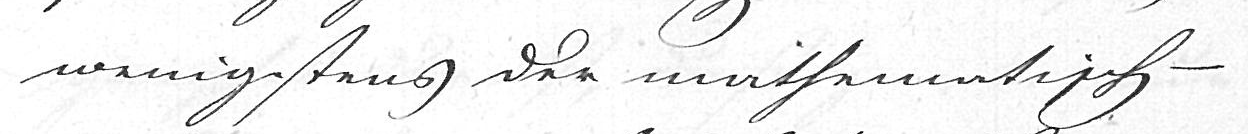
wenigstens der mathematisch-
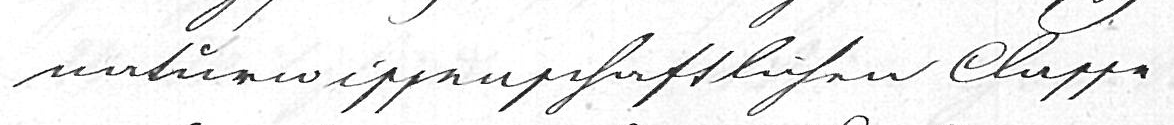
naturwissenschaftlichen Classe
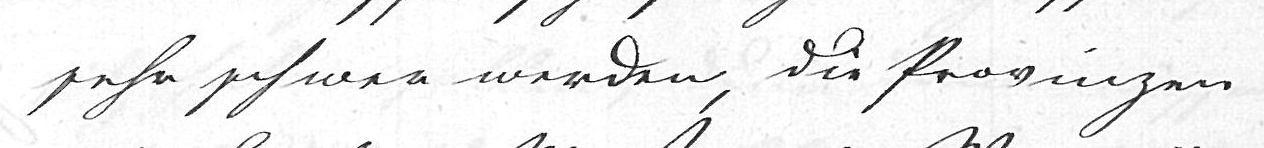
sehr schwer werden, die Provinzen
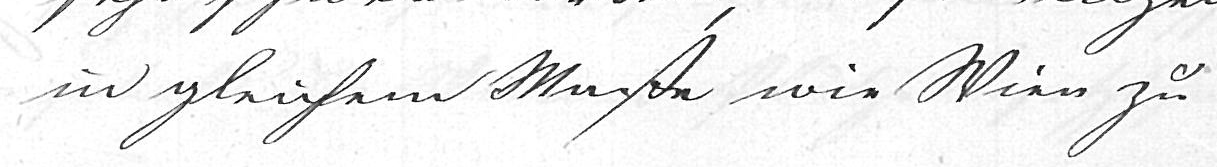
in gleichem Maße wie Wien zu
